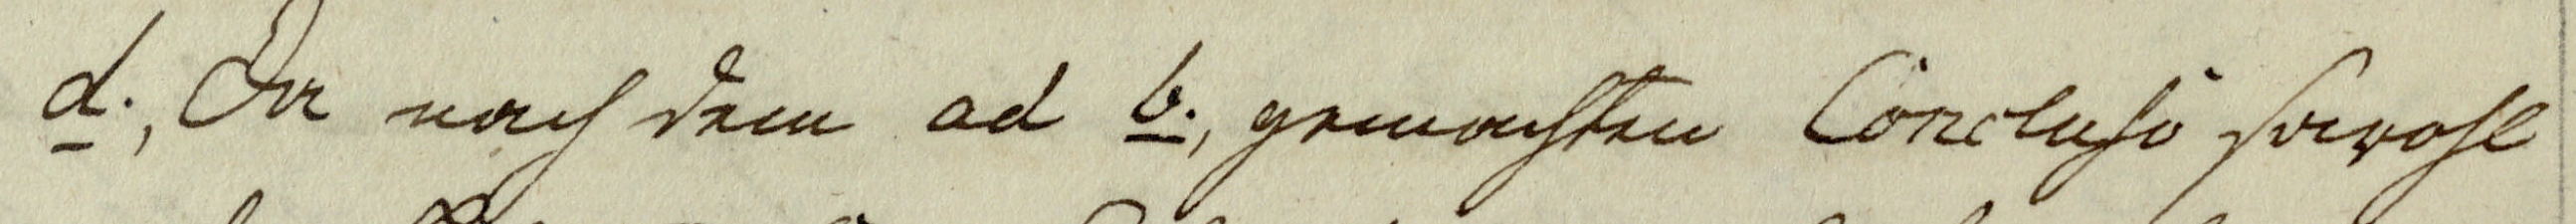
d; Da nach dem ad b. gemachten Concluso sowohl
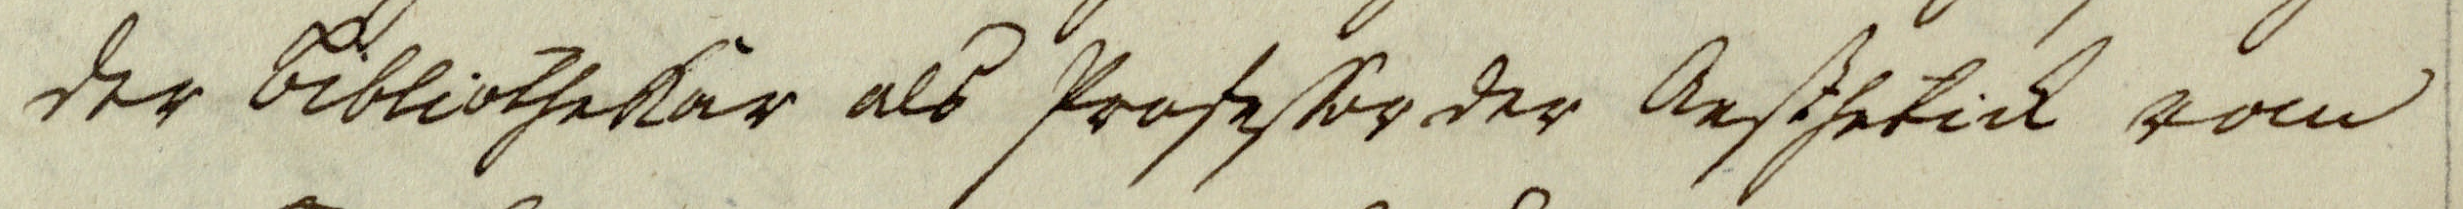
der Bibliothekar als Professor der Aesthetick vom
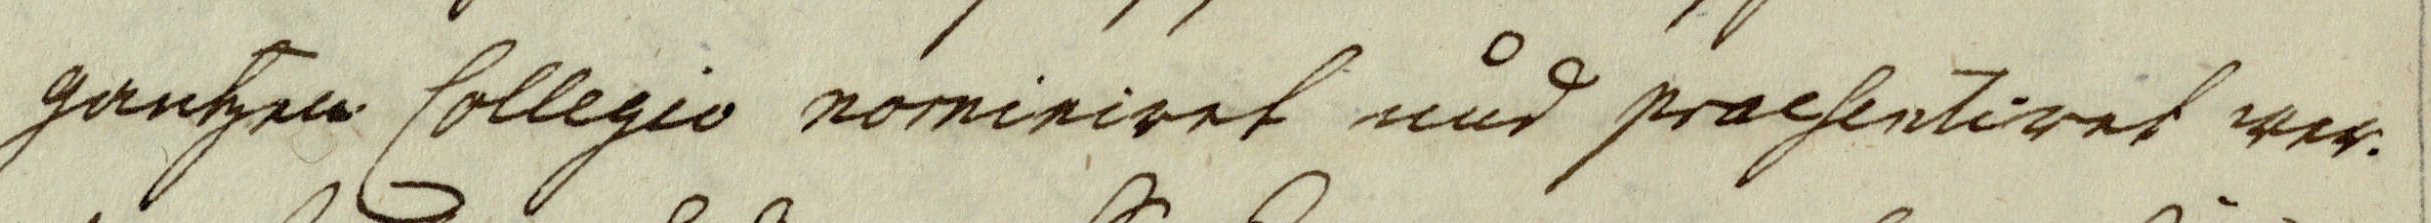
gantzen Collegio nominiret und praesentiret wer¬
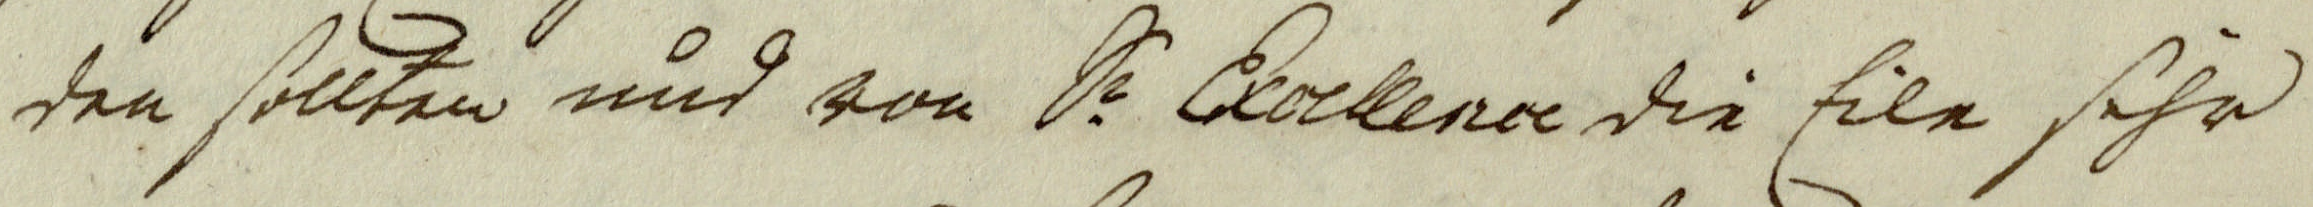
den sollten und von Sr. Excellence die Eile sehr
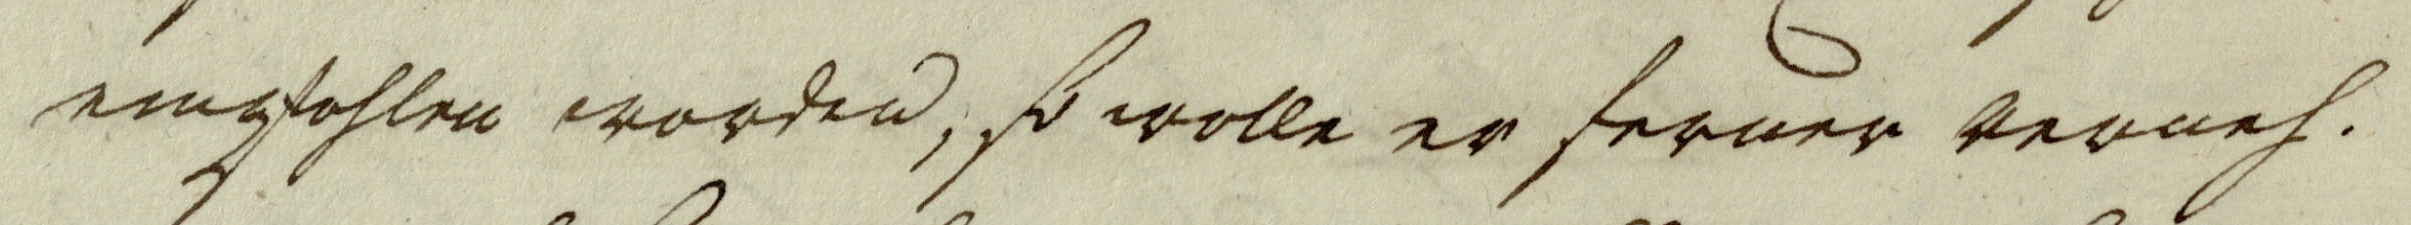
empfohlen worden, so wolle er ferner verneh¬
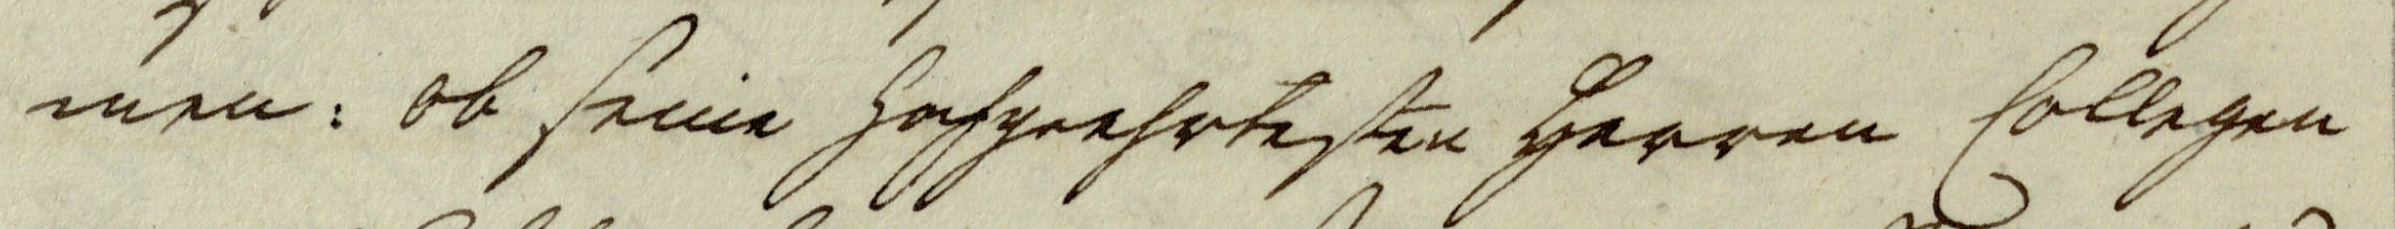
men: ob seine Hochgeehrtesten Herren Collegen
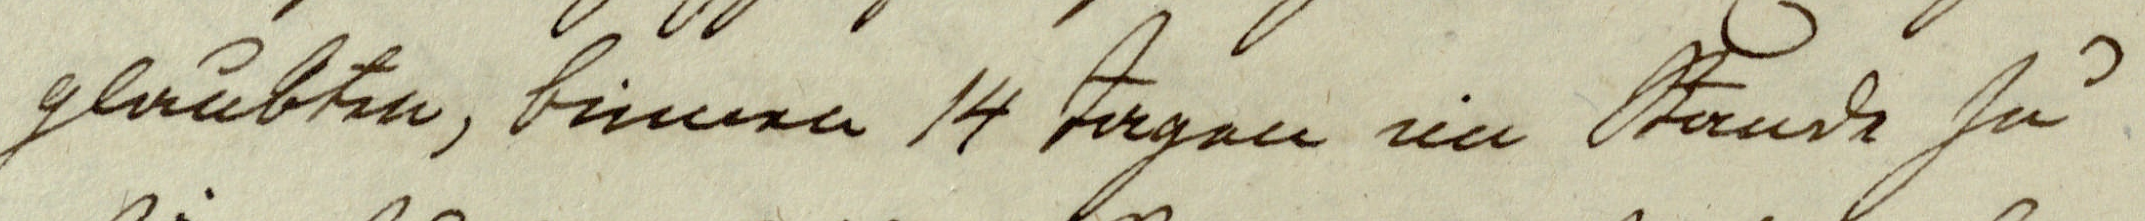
glaubten, binnen 14 Tagen im Stande zu
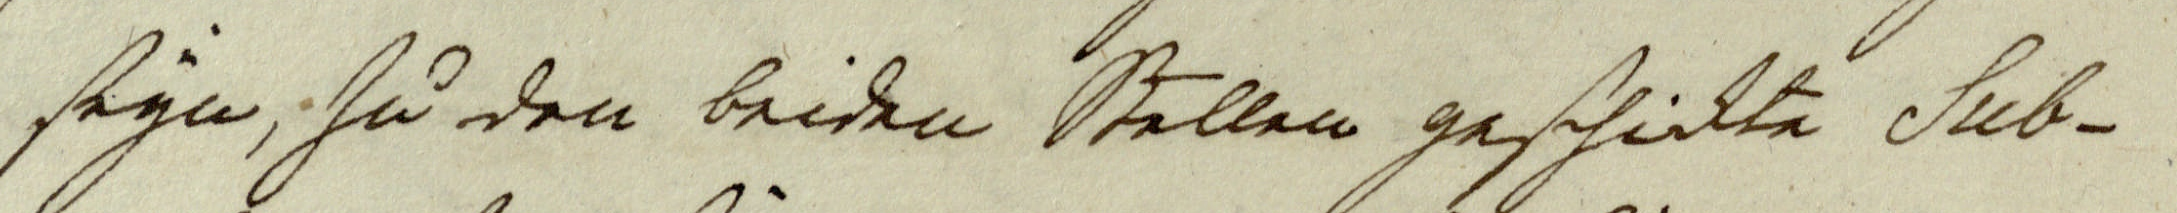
seÿn, zu den beiden Stellen geschickte Sub¬
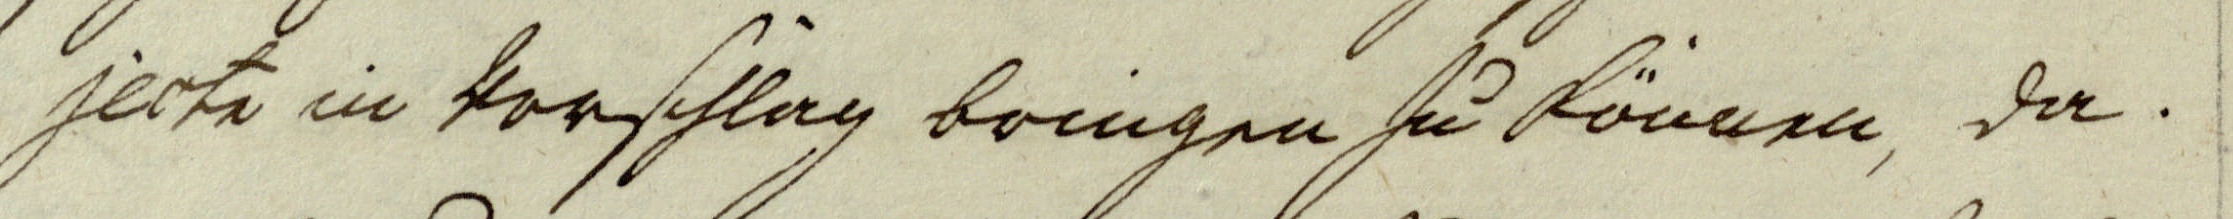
jecte in Vorschlag bringen zu können, da¬
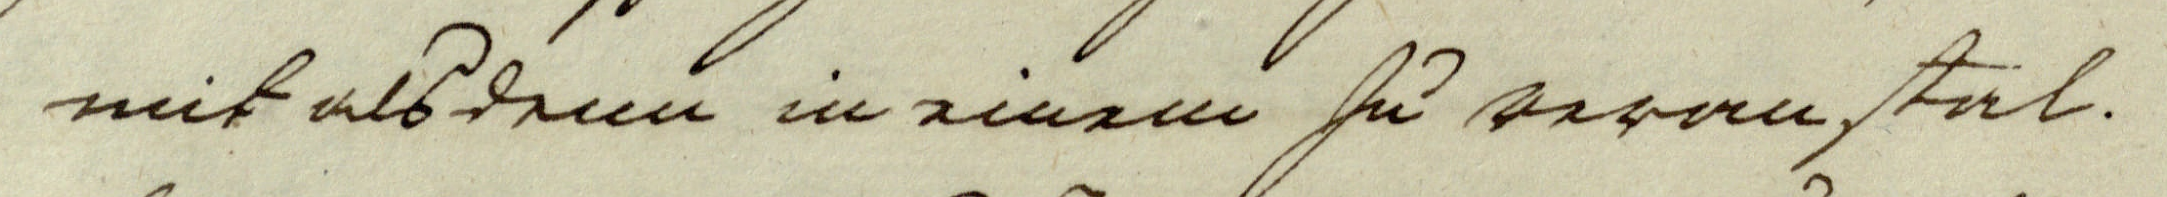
mit alsdann in einem zu veranstal¬
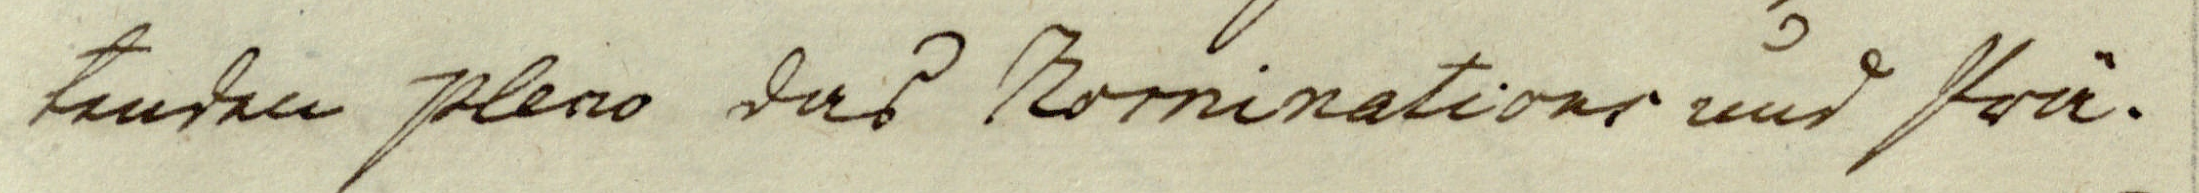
tenden pleno das Nominations und Prä¬
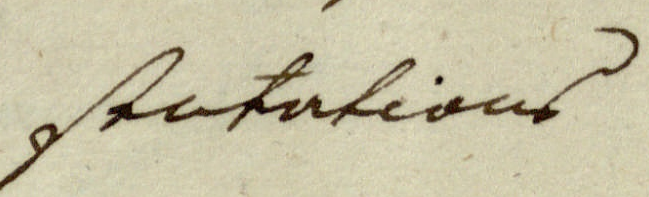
sentations
